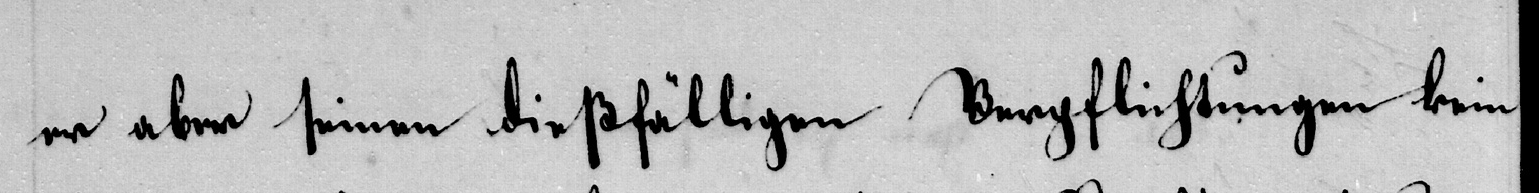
er aber seinen dießfälligen Verpflichtungen kein
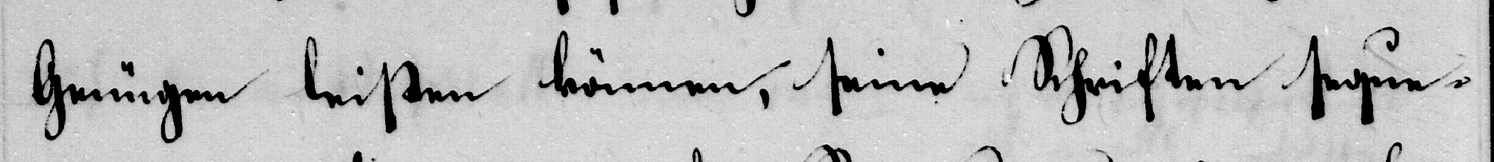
Genüge leisten können, seine Schriften seque¬
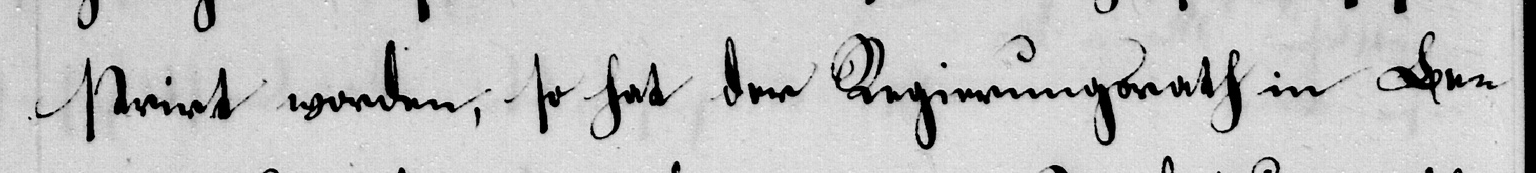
strirt worden, so hat der Regierungsrath in Be¬
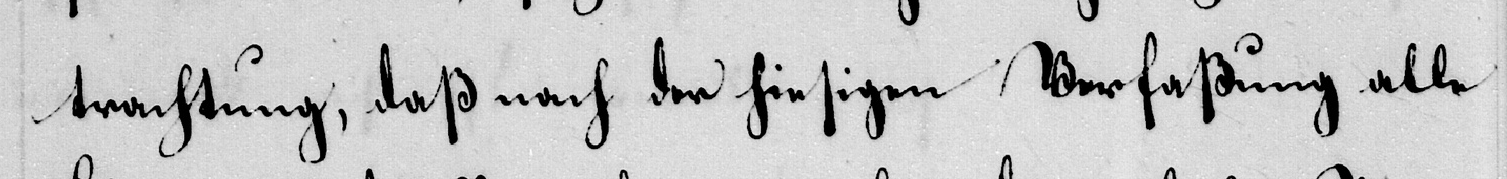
trachtung, daß nach der hiesigen Verfaßung alle
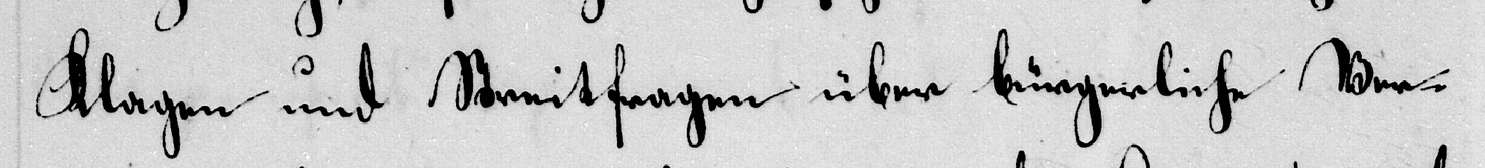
Klagen und Streitfragen über bürgerliche Ver¬
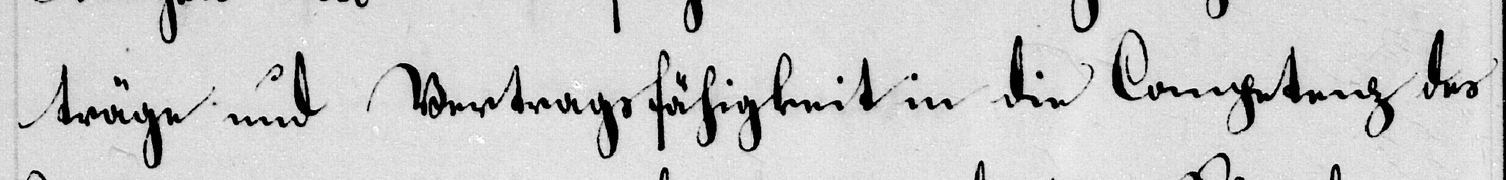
träge und Verhandlungsfähigkeit in die Competenz des
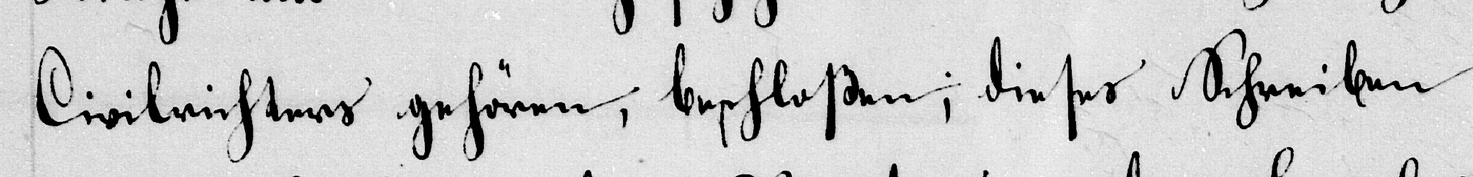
Civilrichters gehören, beschloßen, dieses Schreiben
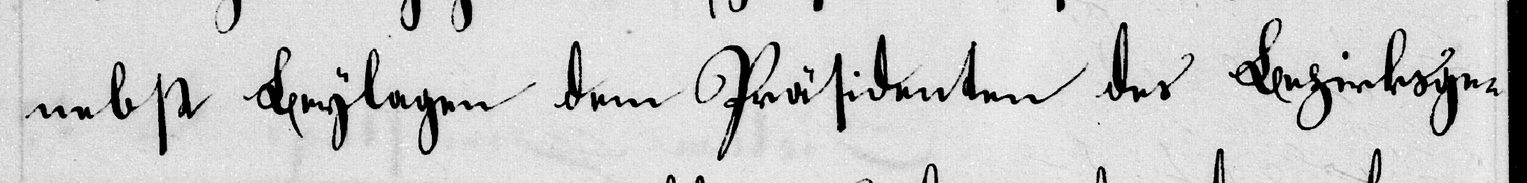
nebst Beylagen dem Präsidenten des Bezirksge¬
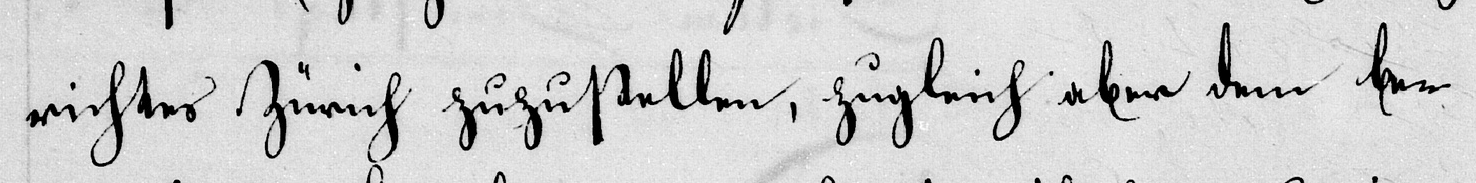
richtes Zürich zuzustellen, zugleich aber dem be¬
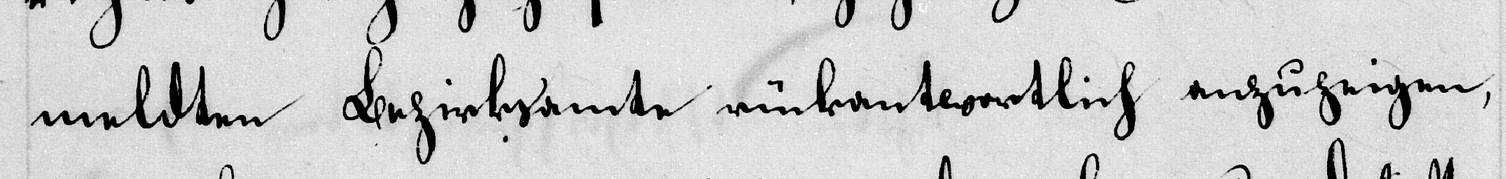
meldten Bezirksamte rückantwortlich anzuzeigen,
